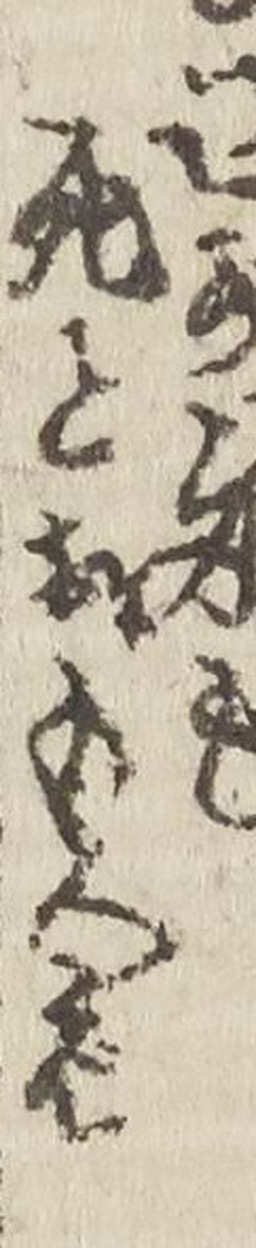死とおもへば
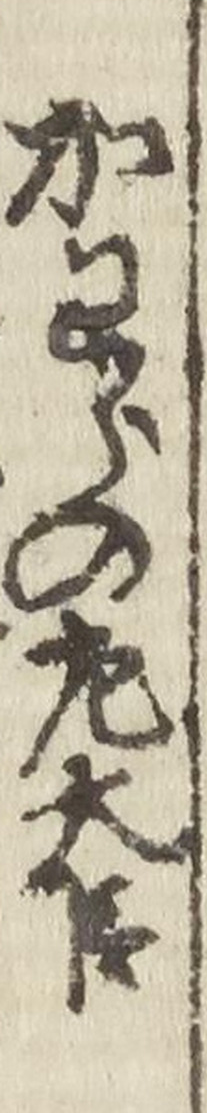かわらの左大臣
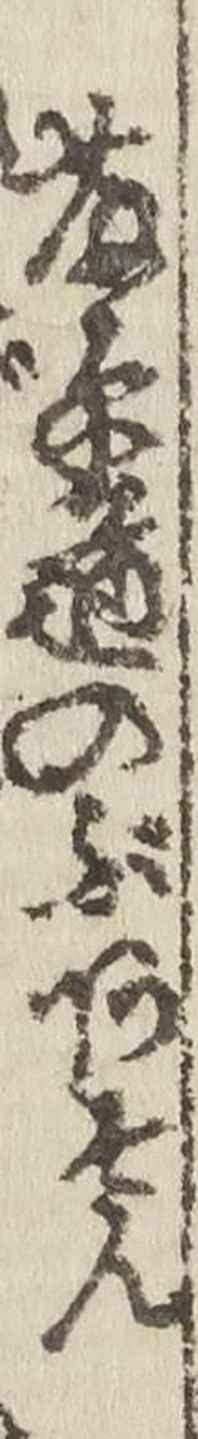藤原道のぶあそん
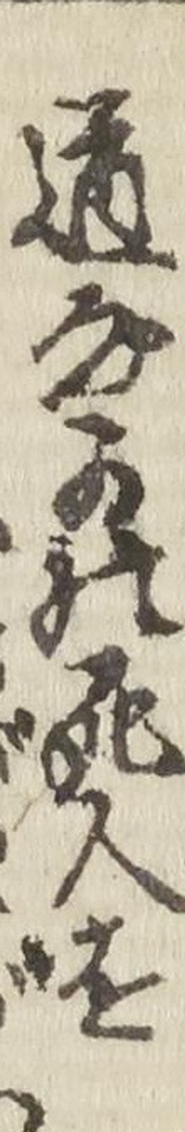道なかの死人を
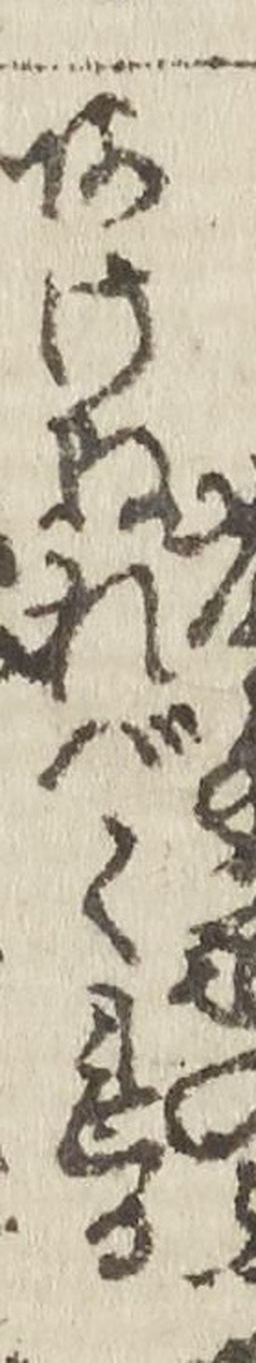あけぬればくれる
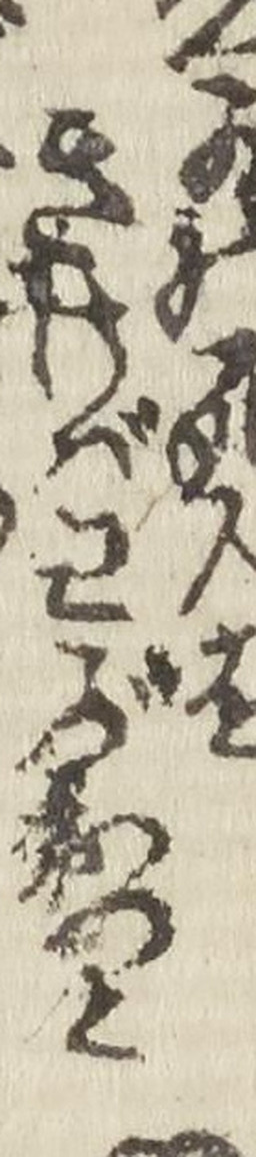きけばわがおつと
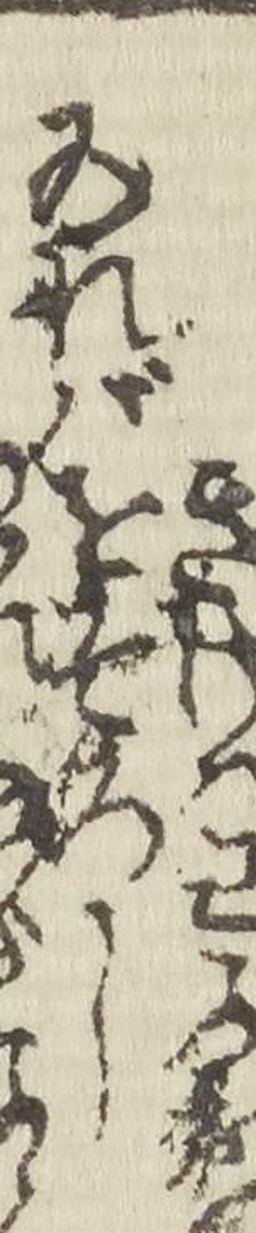みればをそろし
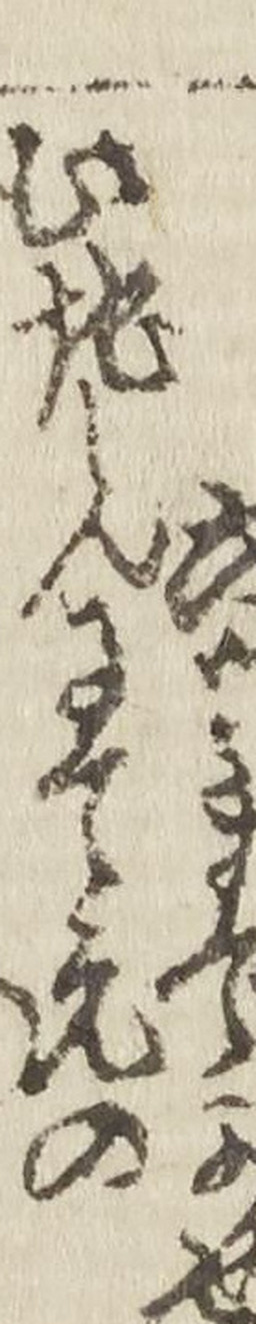此地しんにて元の
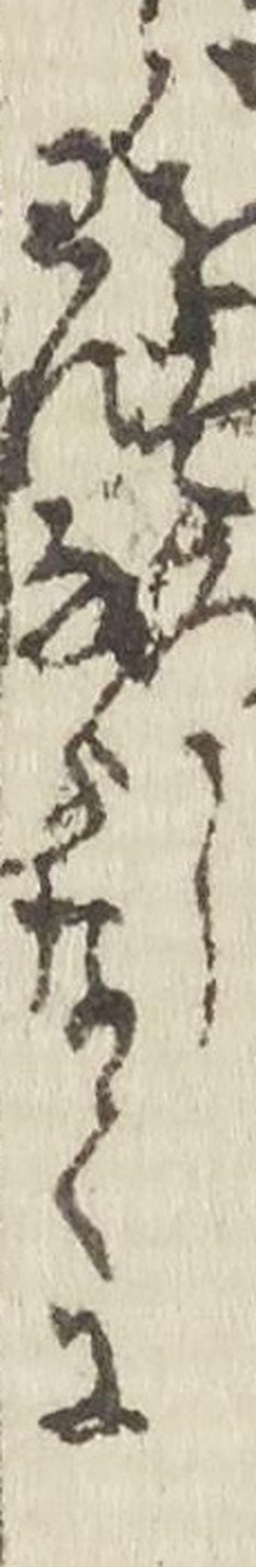われならなくに
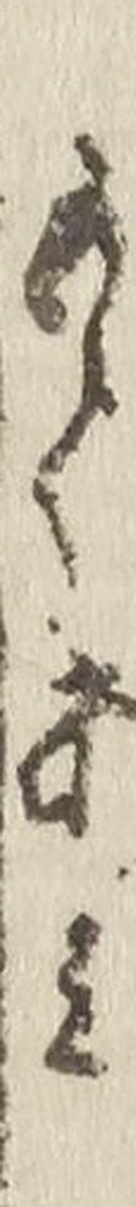もくあみ
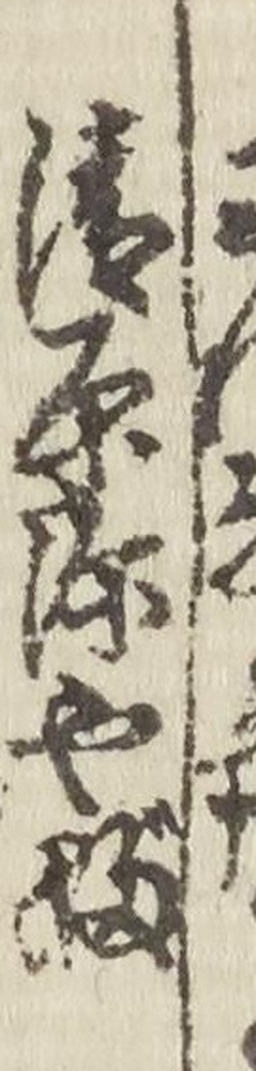清原深やぶ
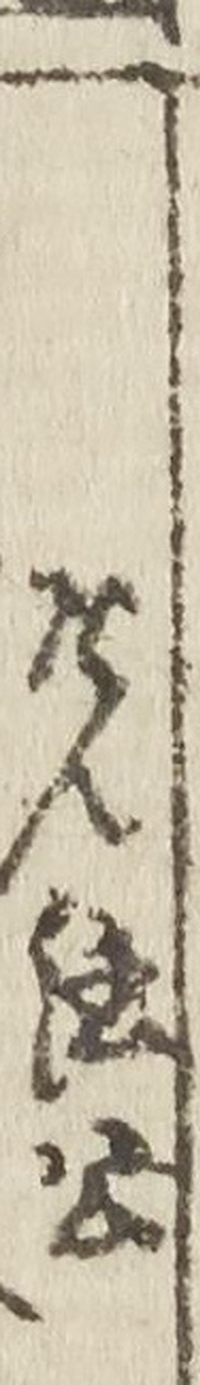けん徳公
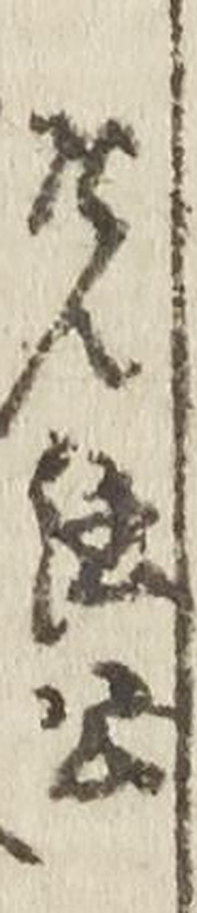けん徳公
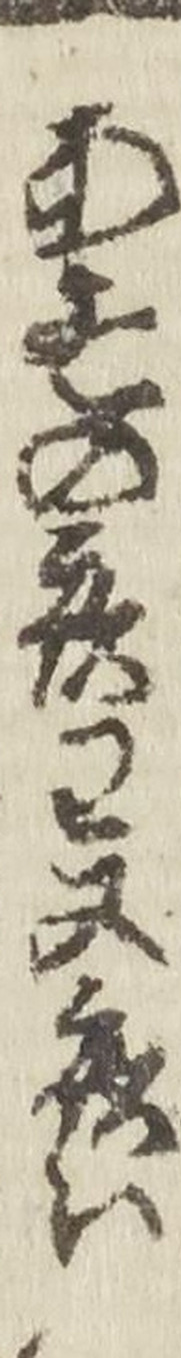あすの夜わ又夜い
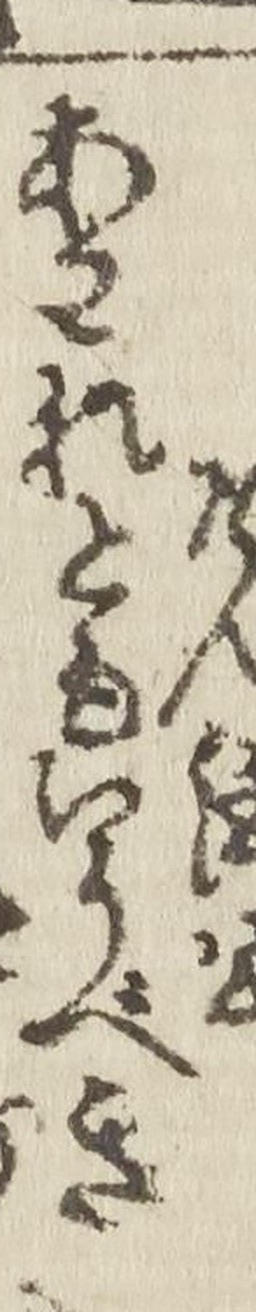あわれともいうべき
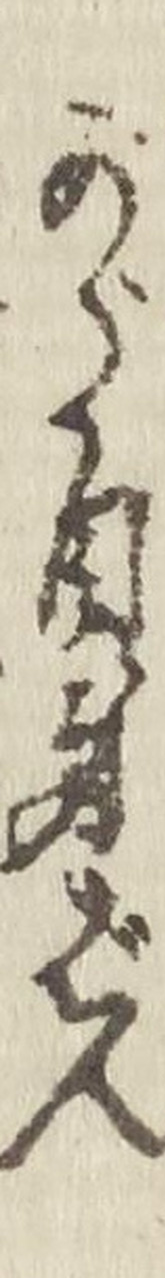から自身ばん
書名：しんぱん三十六哥仙
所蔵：東京大学地震研究所図書室 Earthquake Research Institute Library, The University of Tokyo, JAPAN
